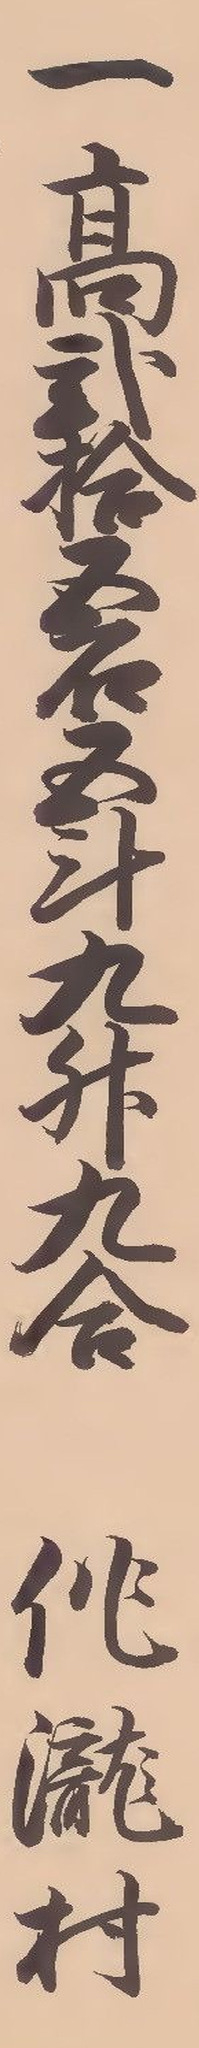一高弐拾五石五斗九升九合作滝村
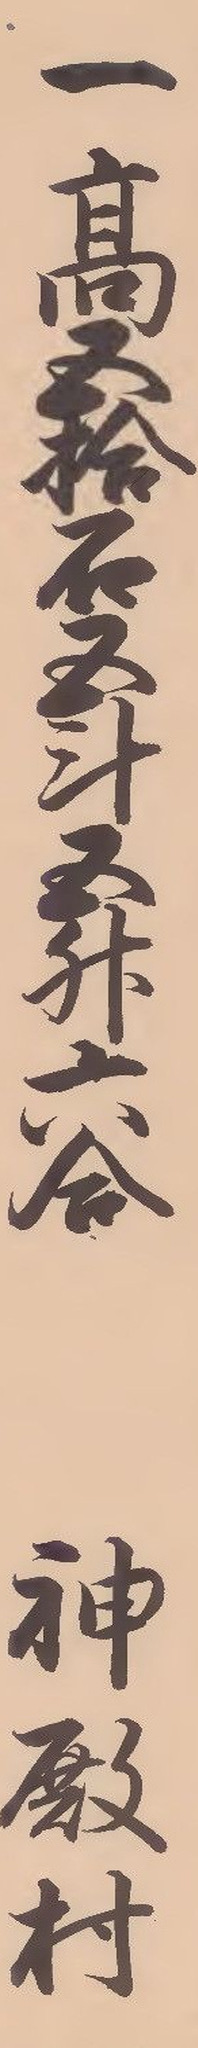一高五拾石五斗五升六合神殿村

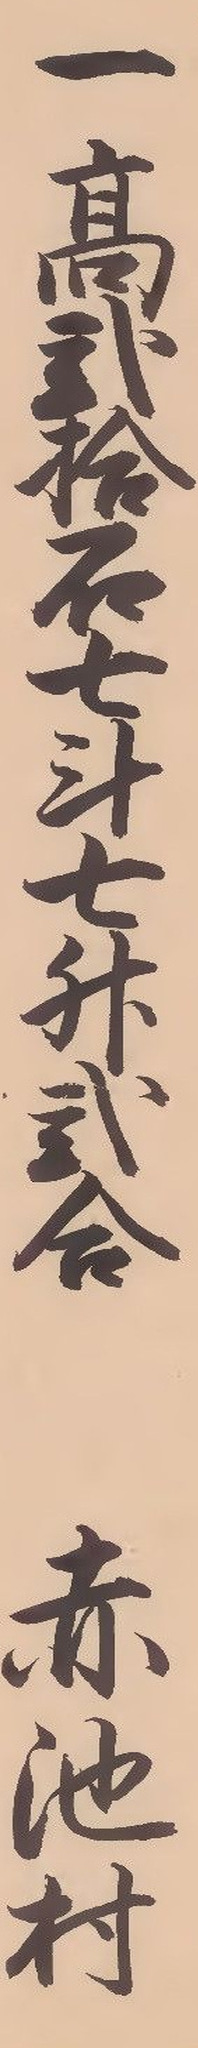一高弐拾石七斗七升弐合赤池村
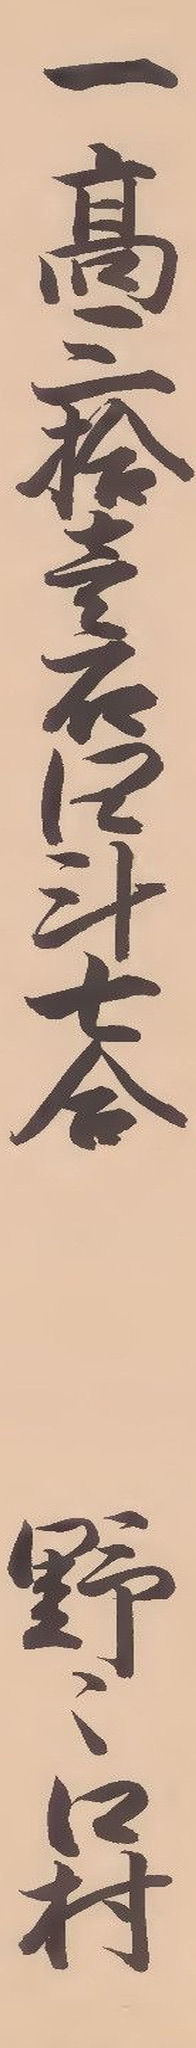一高三拾壱石四斗七合野々口村
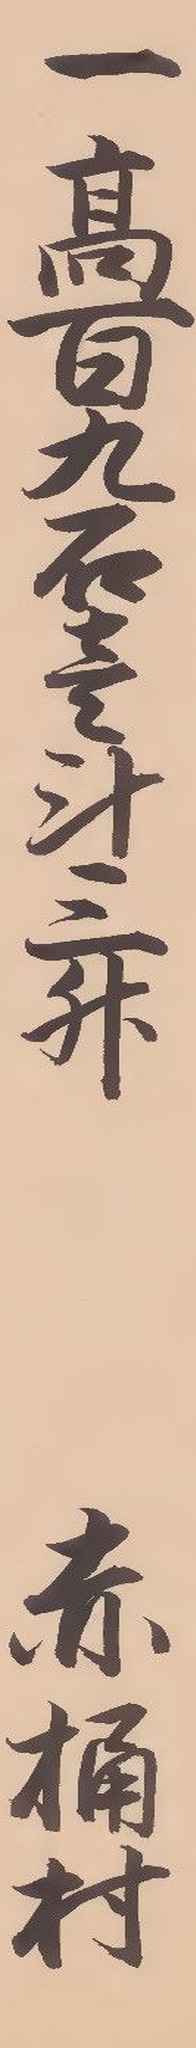一高百九石壱斗三升赤桶村
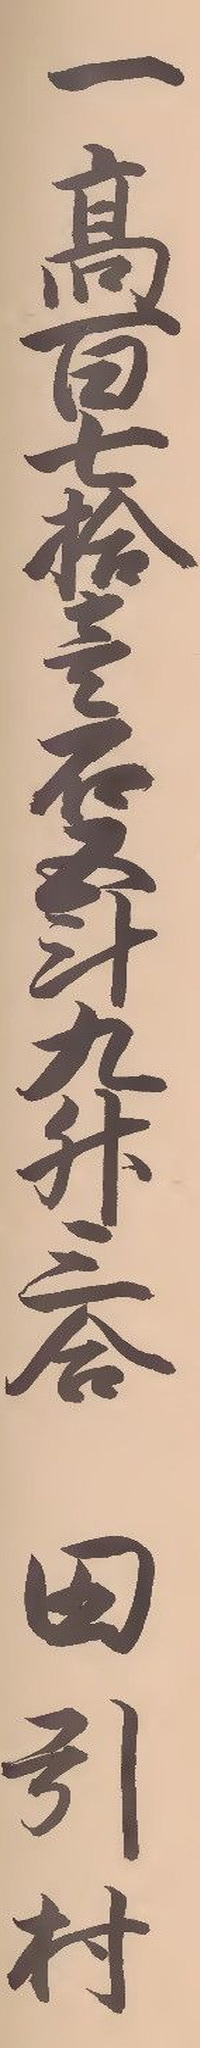一高百七拾壱石五斗九升三合田引村
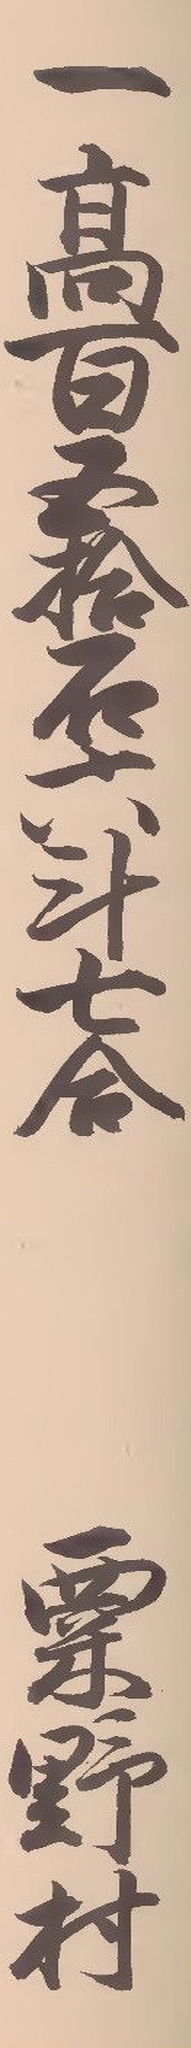一高百五拾石六斗七合粟野村
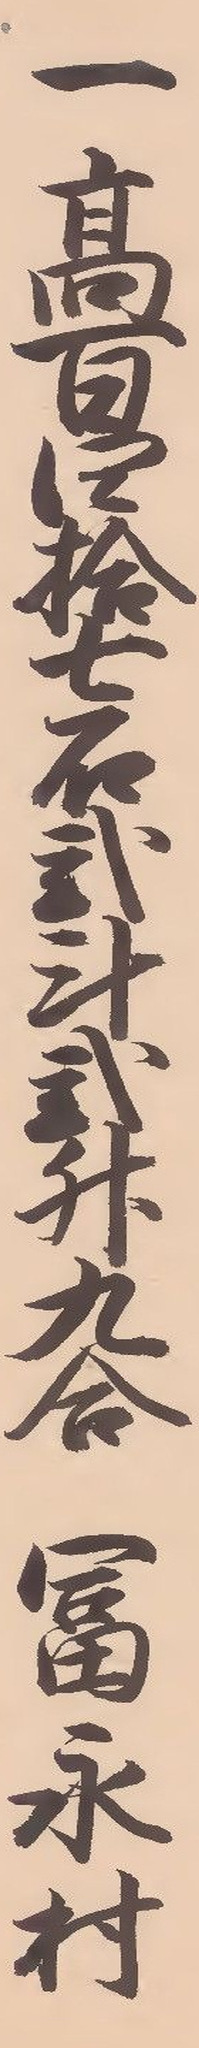一高百四拾七石弐斗弐升九合富永村
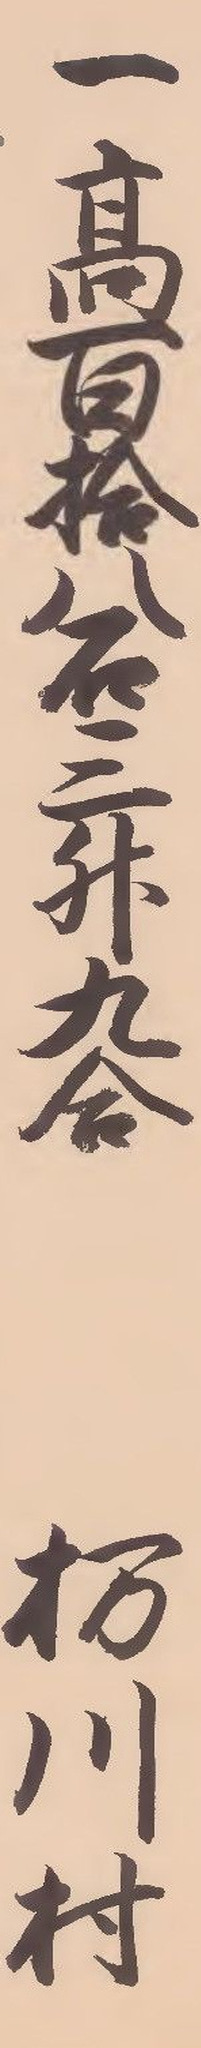一高百拾八石三升九合栃川村
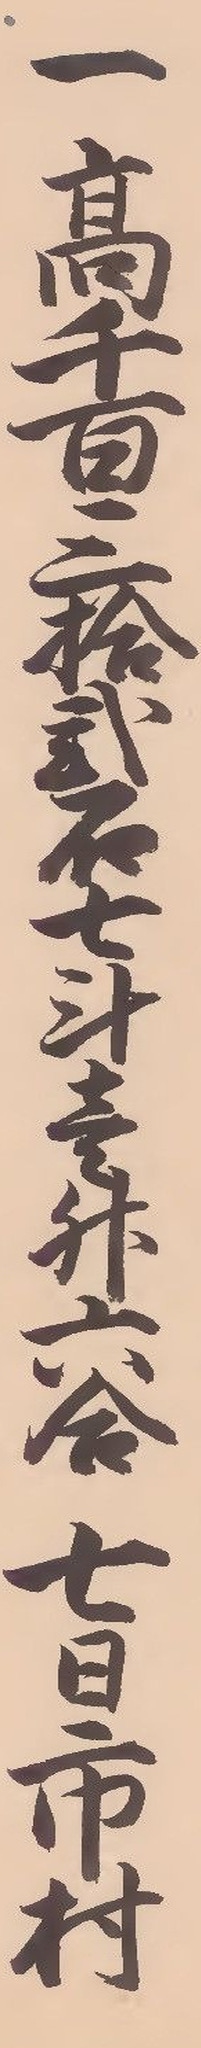一高千百三拾弐石七斗壱升六合七日市村

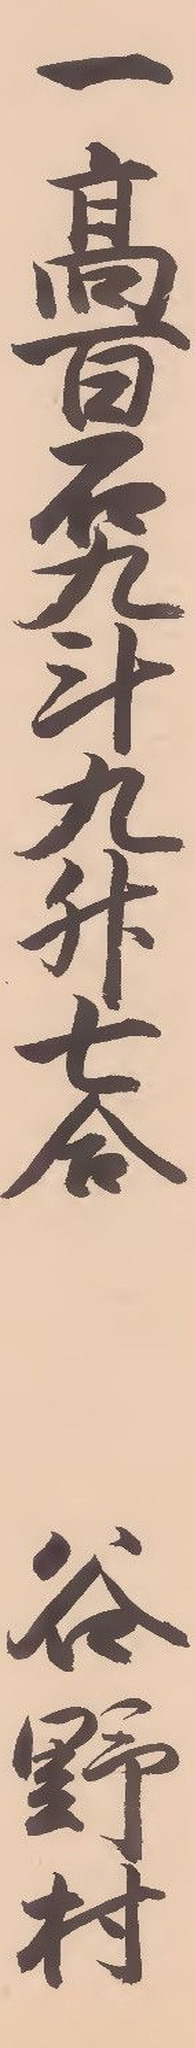一高百石九斗九升七合谷野村
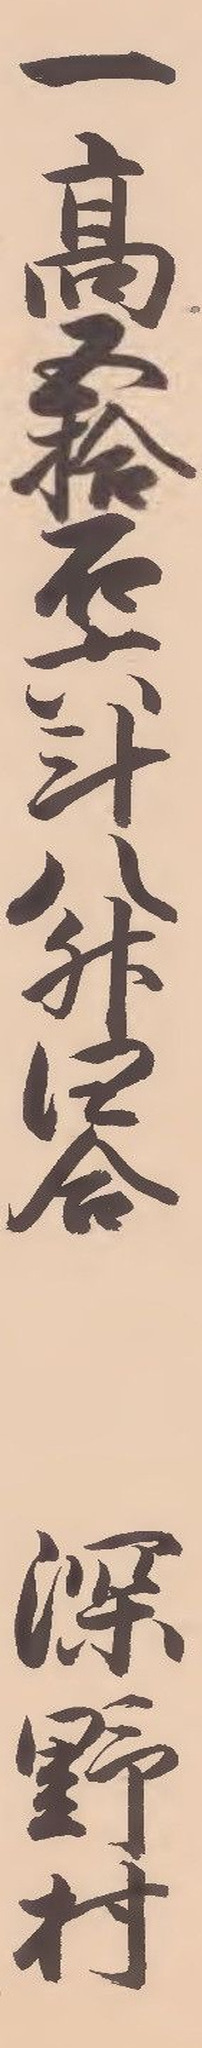一高五拾石六斗八升四合深野村
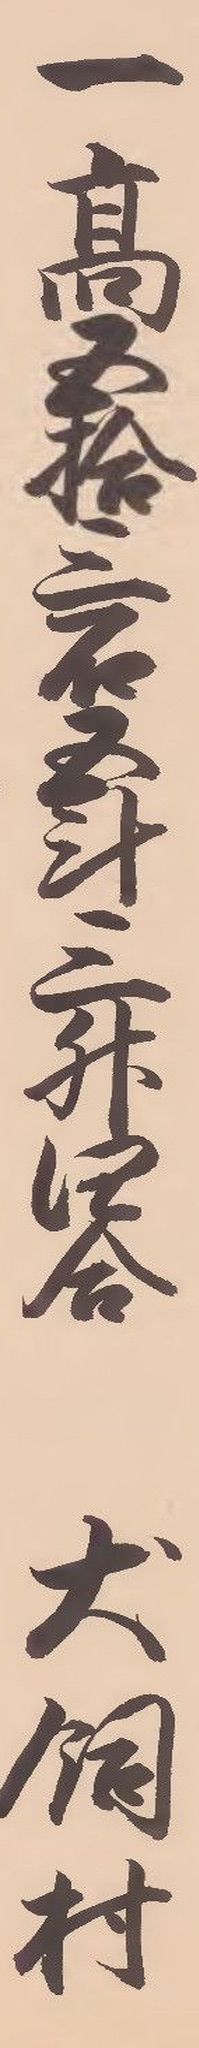一高五拾三石五斗三升四合犬飼村
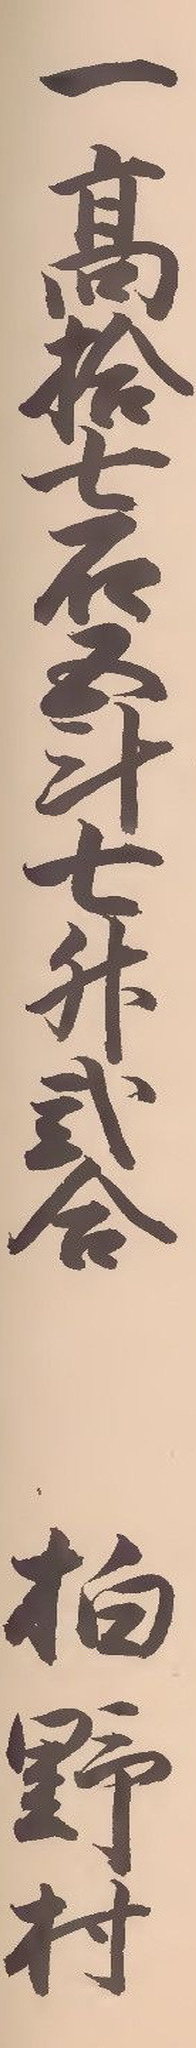一高拾七石五斗七升弐合柏野村
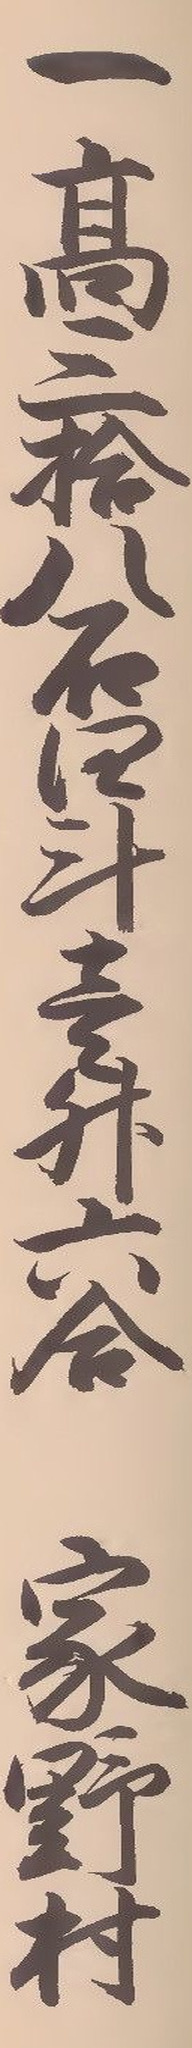一高三拾八石四斗壱升六合家野村
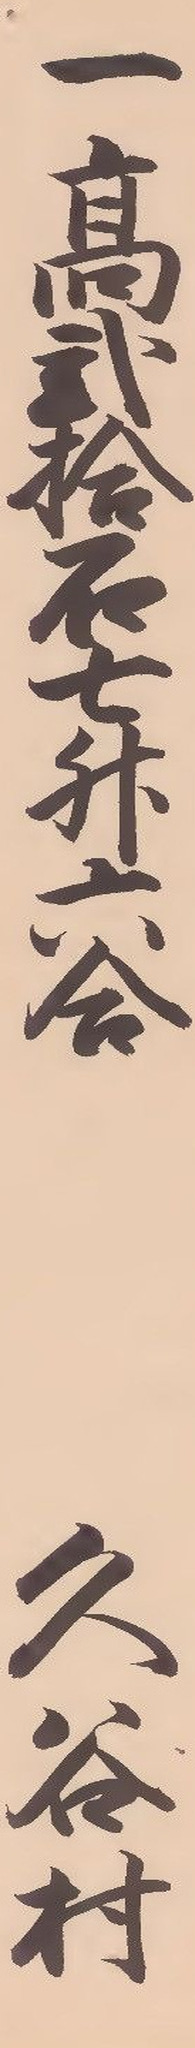一高弐拾石七升六合久谷村
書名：伊勢国郷帳
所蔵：国立公文書館 National Archives of Japan
